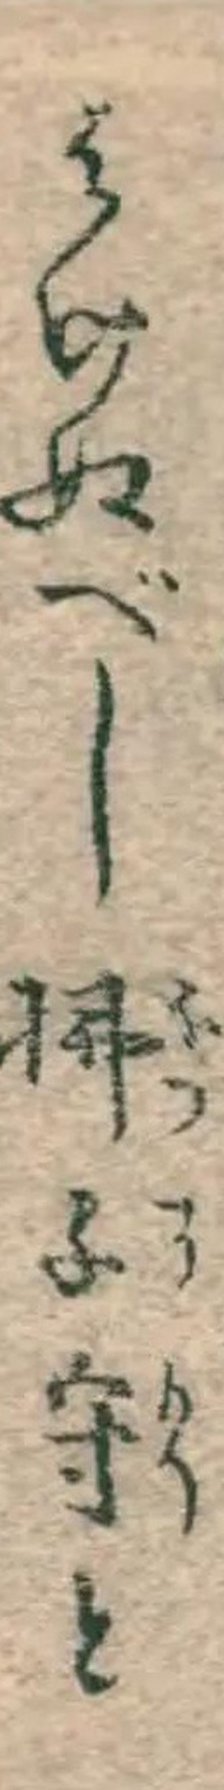はけぬべし拂子守と
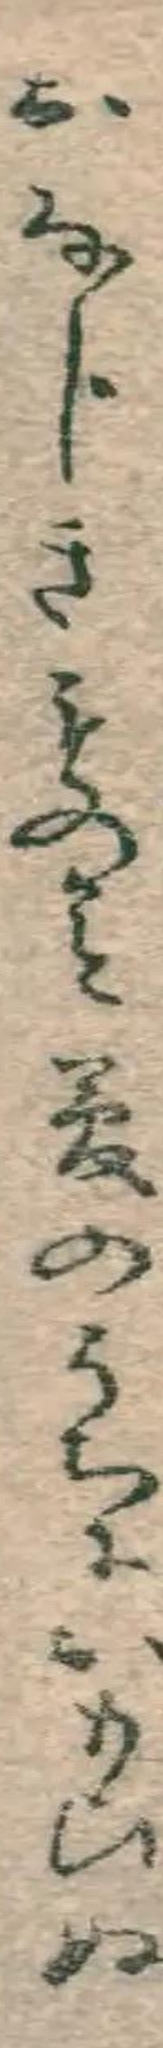おなじきものと夢うちにおもひぬ
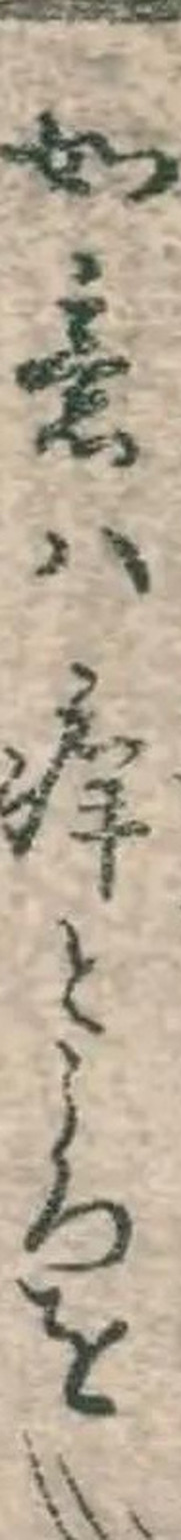如意は痒ところを
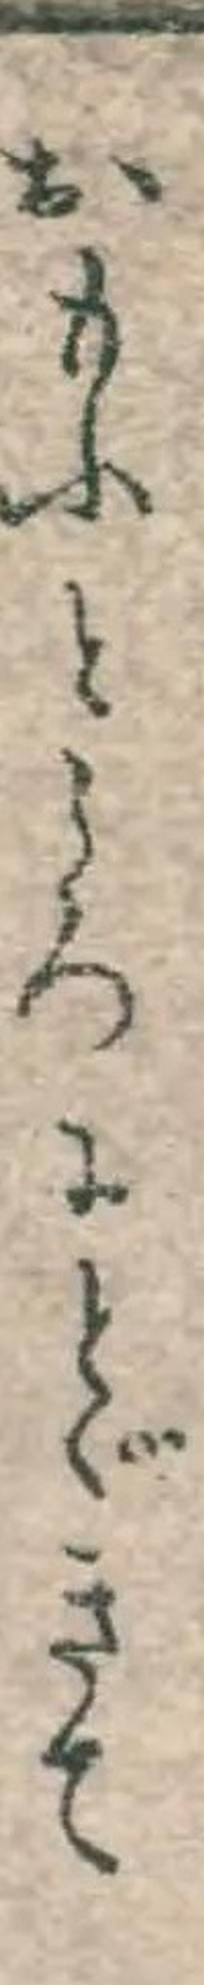おもふところにとゞきて
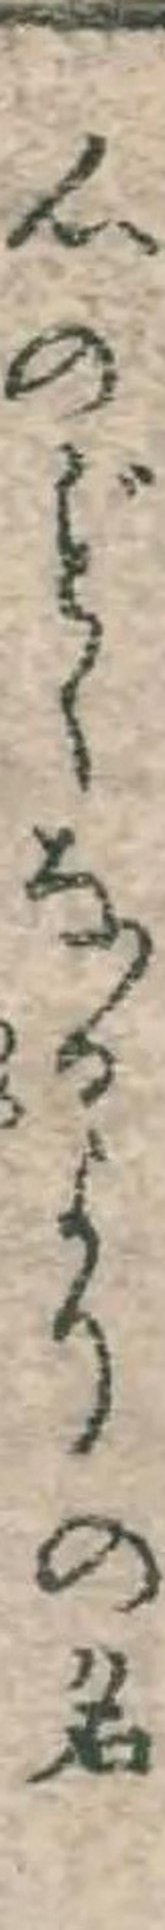心のごとくなるよりの名
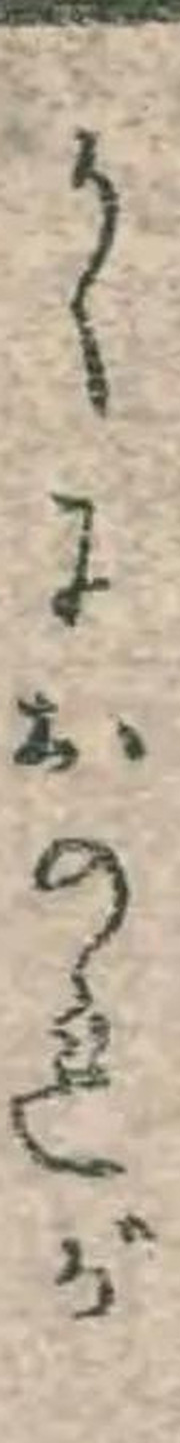かくにおのれが
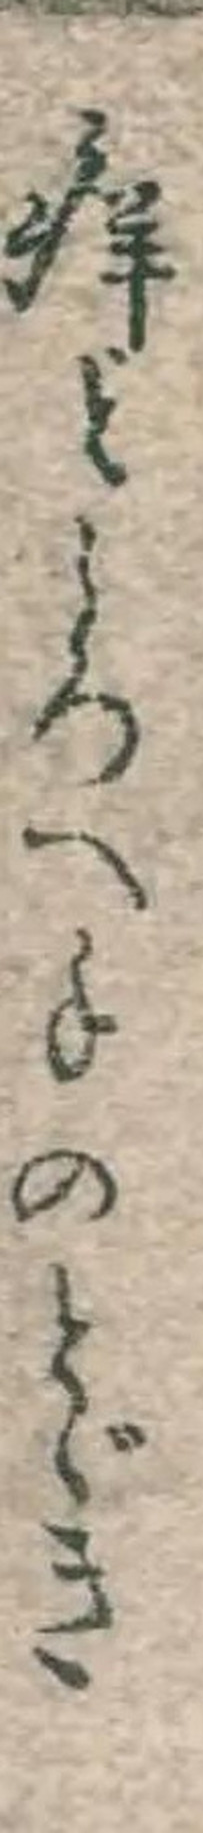痒ところへ手のとゞき
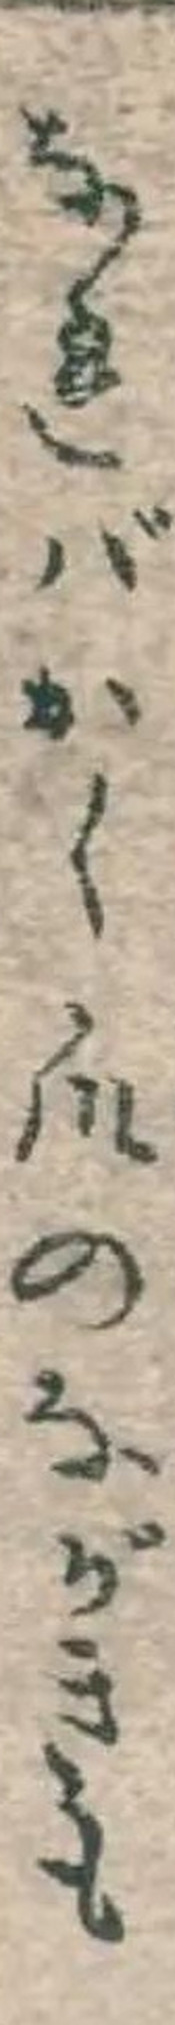なればかく爪のながきも
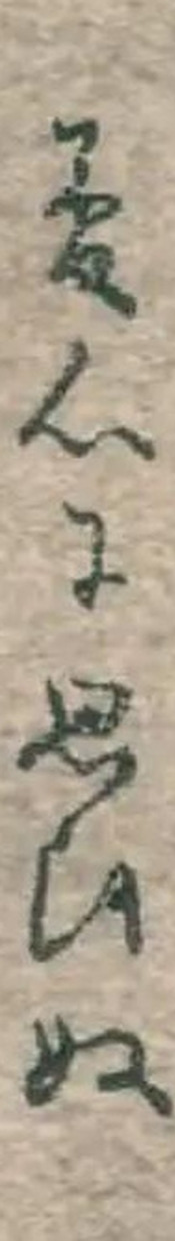夢心に思ひぬ

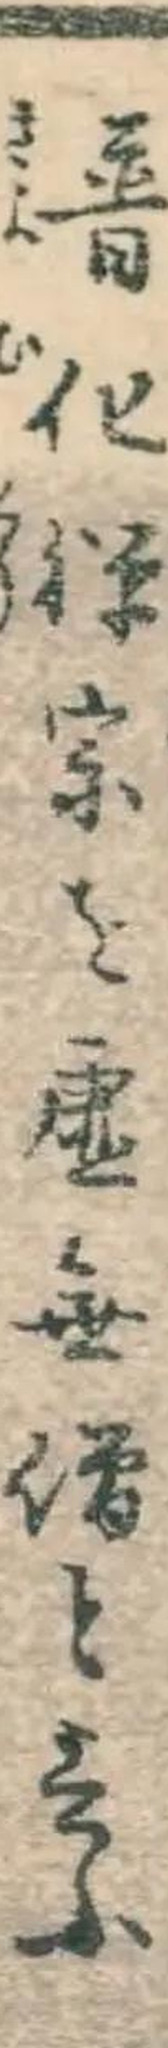普化禅宗を虚無僧と言ふ
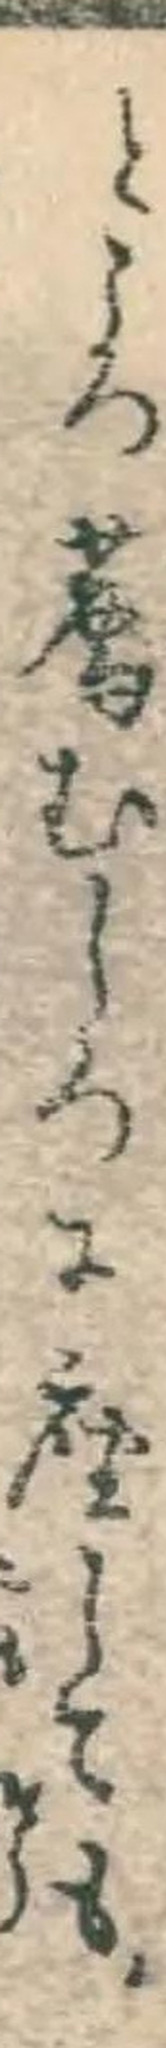ところ薦むしろに座しても
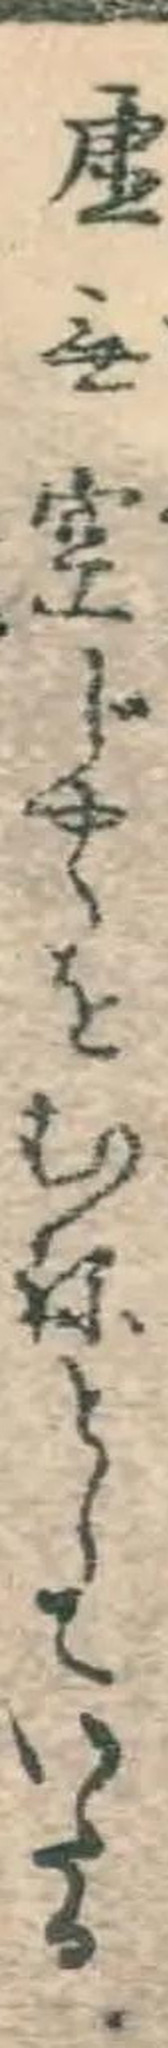虚無空じやくをむねとしていたる
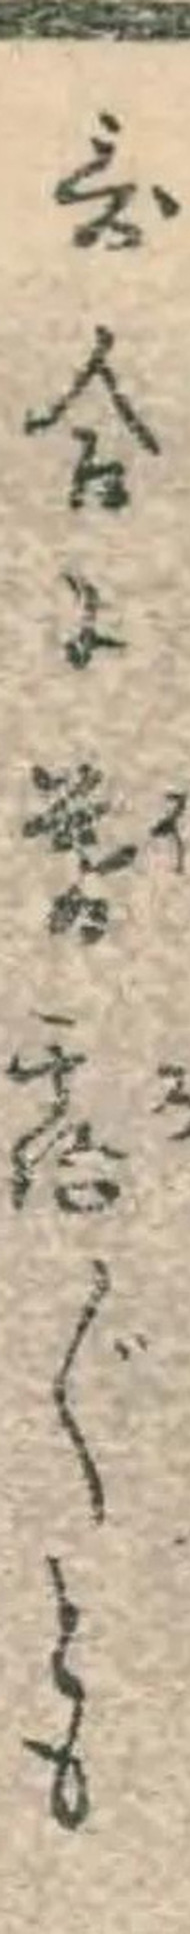哥合に暮露〴〵とも
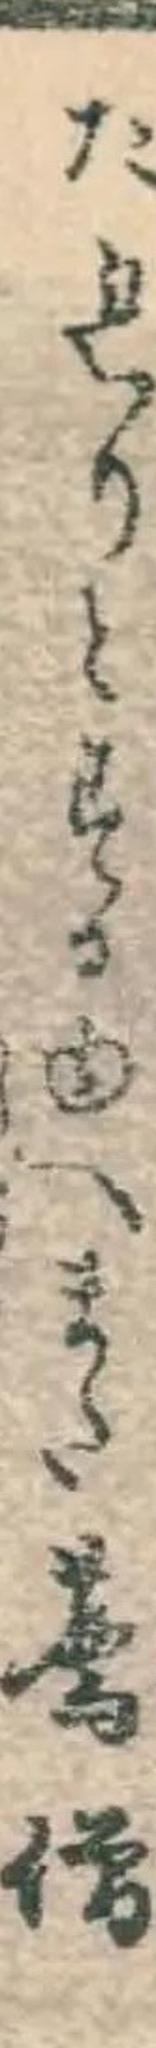たれりとするゆへまた薦僧
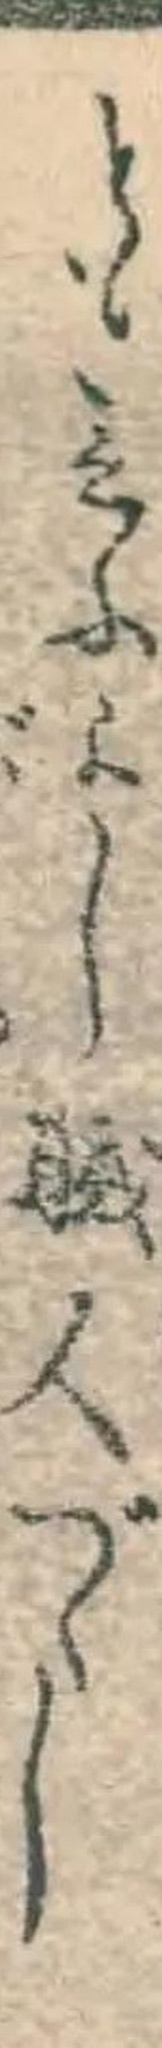とも言ふよし職人づくし
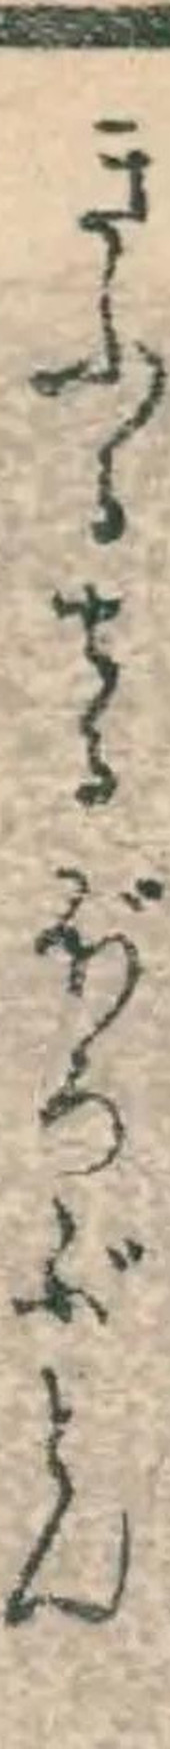きふるせるぼろぶとん
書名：百鬼徒然袋 3巻. [2]
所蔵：国立国会図書館 National Diet Library, JAPAN
